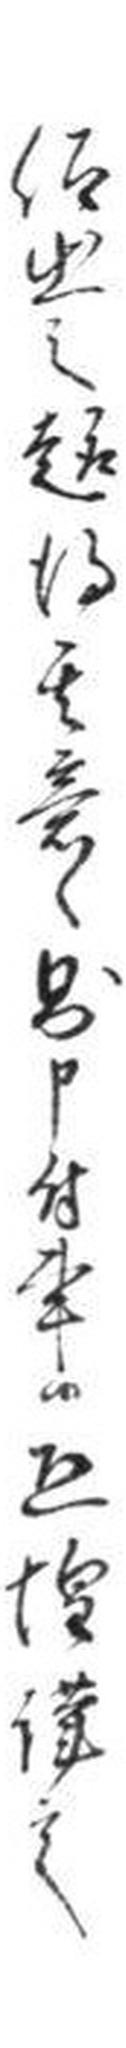仰出之趣得其意候則申付事候恐惶謹言
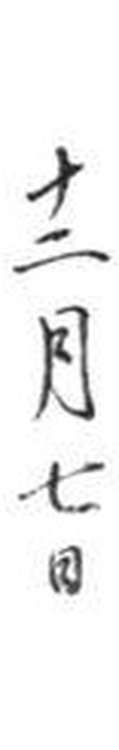十二月七日
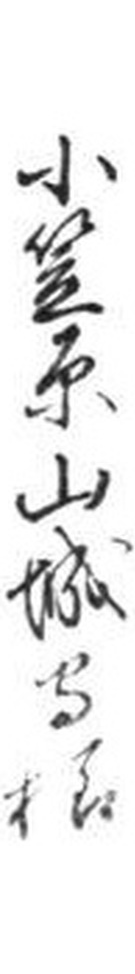小笠原山城守様
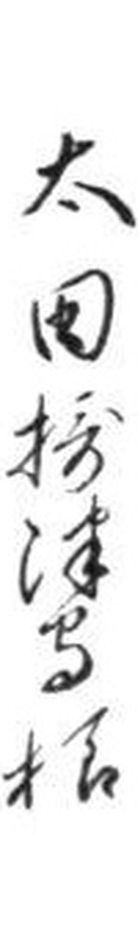太田摂津守様
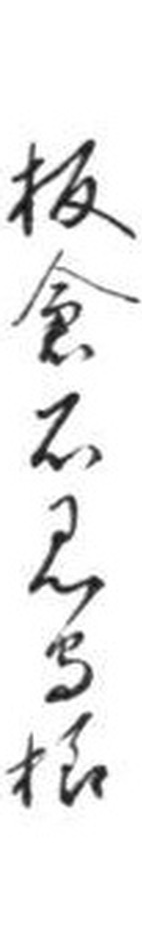板倉石見守様
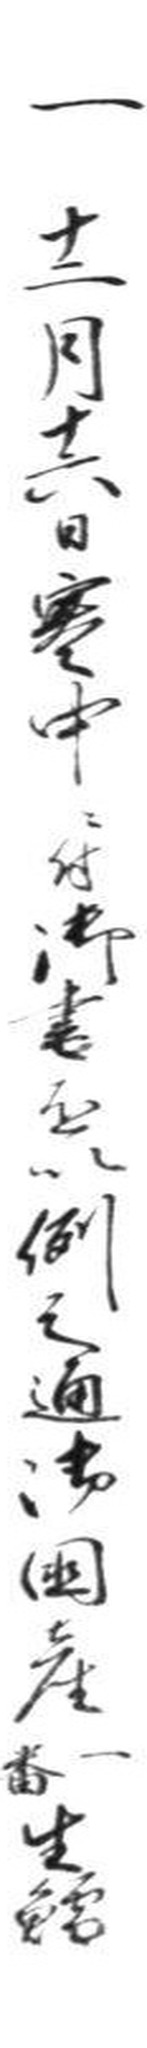一十二月十六日寒中ニ付御書を以例之通御国産一番生鱈
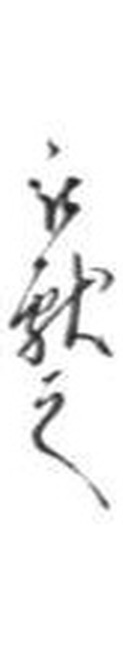被献之
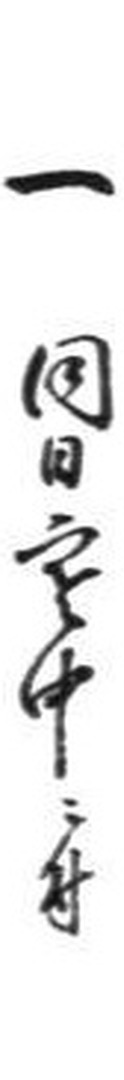一同日寒中ニ付
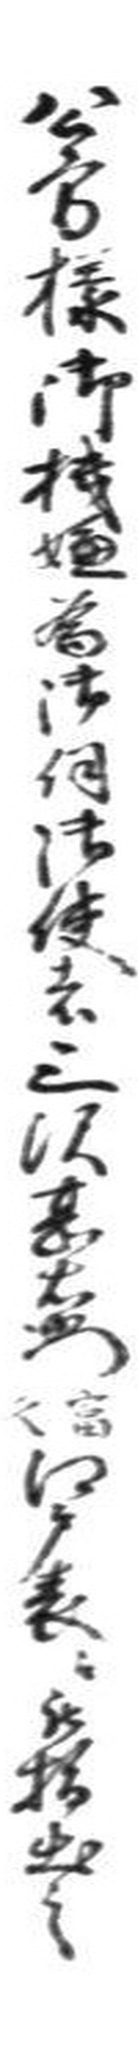公方様御機嫌為御伺御使者三沢甚右衛門富久江戸表江被指出之
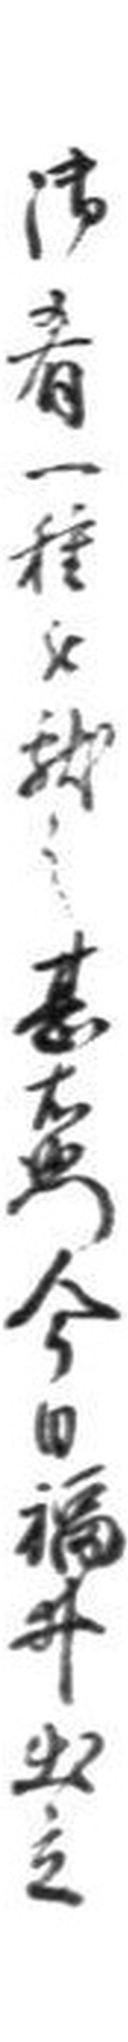御肴一種被献之甚右衛門今日福井出立
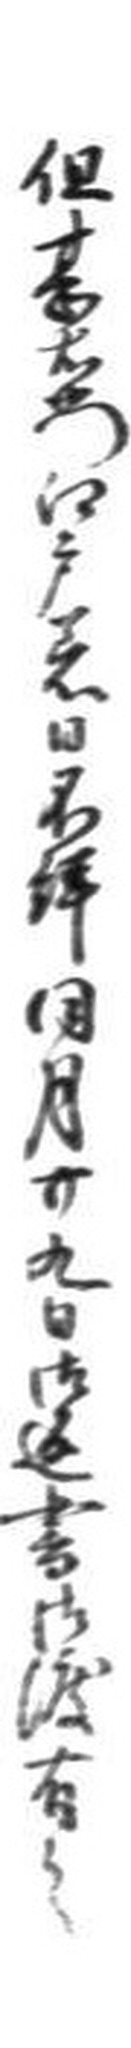但甚右衛門江戸着日不詳同月廿九日御返書御渡有之
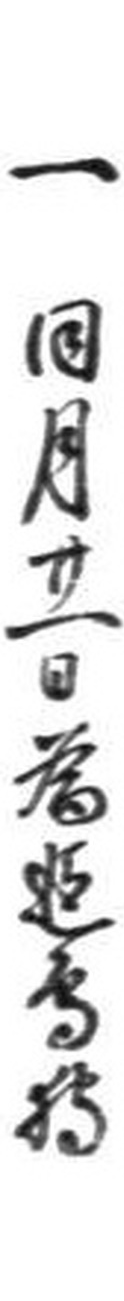一同月廿一日為追鳥狩
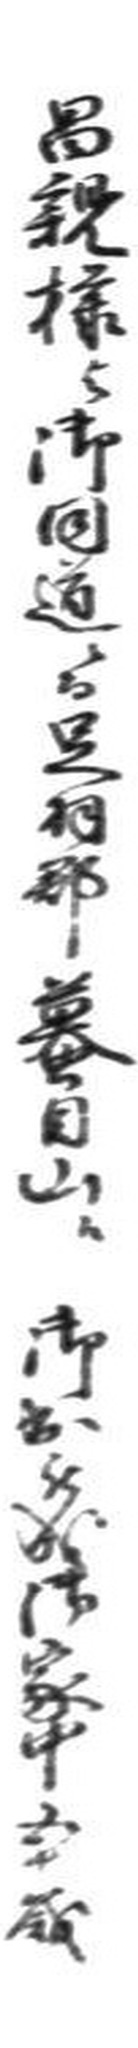昌親様と御同道ニ而足羽郡蟇目山江御出被成御家中五十歳
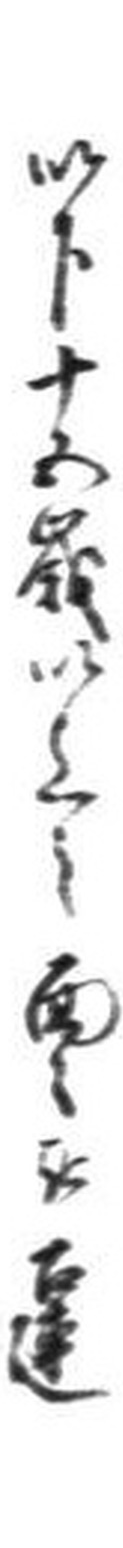以下十五歳以上之面々被召連
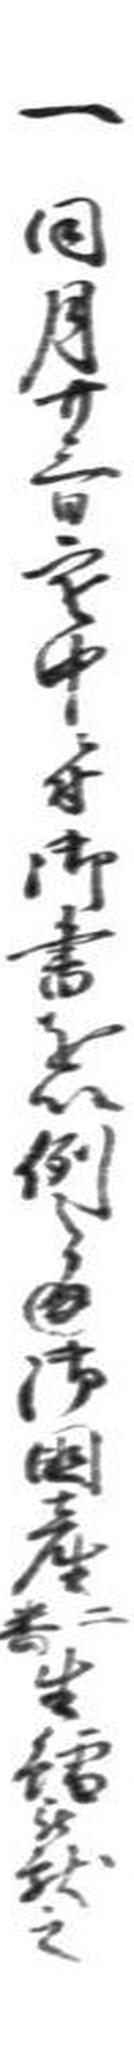一同月廿三日寒中ニ付御書を以例之通御国産二番生鱈被献之
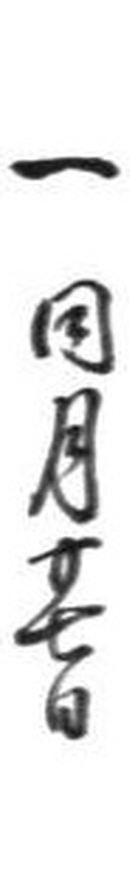一同月廿七日
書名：家譜 十三 綱昌公 従寛文元年到延宝五年
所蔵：福井県文書館 Fukui Prefectural Archives
